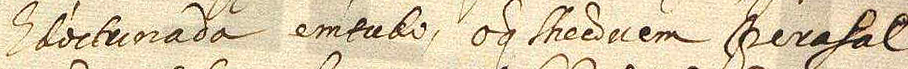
E doctrinada em tudo, o q̄ lhe cōuem per sal
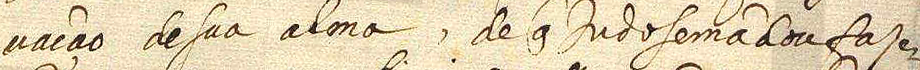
uação de sua alma, de q̄ tudo se mādou fazer
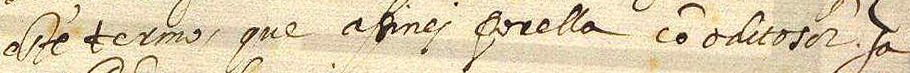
este termo, que assinei por ella cō o dito sor̄ Ja
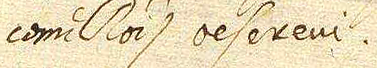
come Roīz o escreui.
